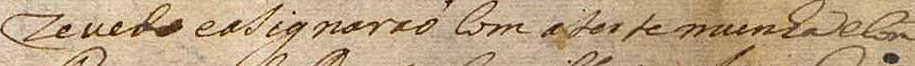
Zeuedo e asignaraõ Com a testemunha e Com
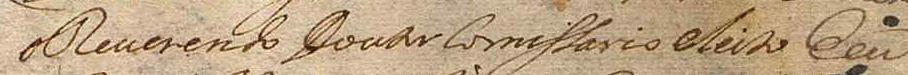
o Reuerendo Doutor Comissario eleito E eu
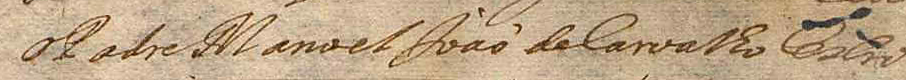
o Padre Manoel Joaõ de Carvalho EsCri
